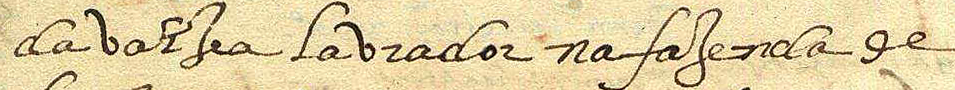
da varzea Laurador na fazenda de
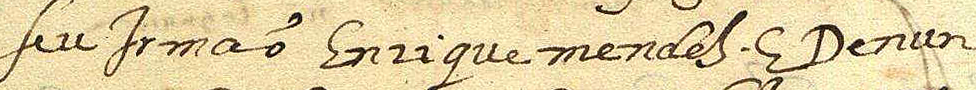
seu Jrmaõ Enrique mendez. E Denun
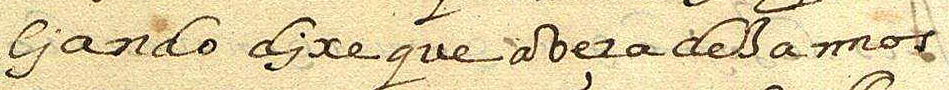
cjando djxe que avera dez annos
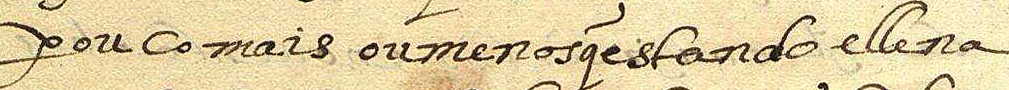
pouco mais ou menos q̄ estando elle na
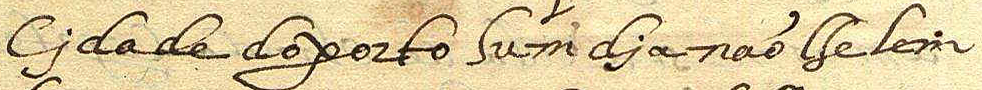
Cjdade do porto hum dja naõ lhe lem
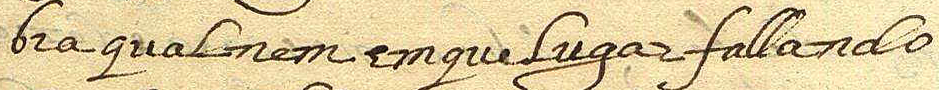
bra qual nem Em que Lugar fallando
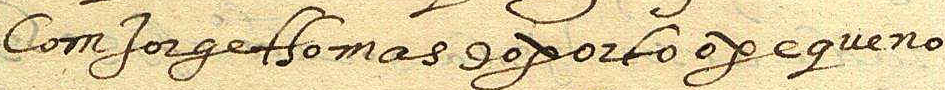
Com Jorge thomas do porto o pequeno
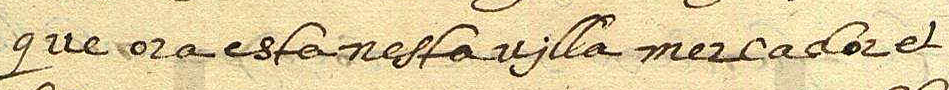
que ora esta nesta ujlla mercador &
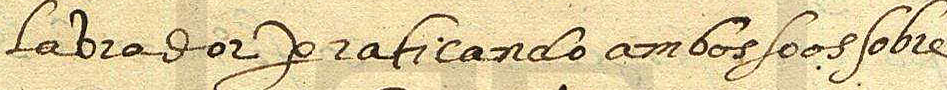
Lavrador praticando ambos soos sobre
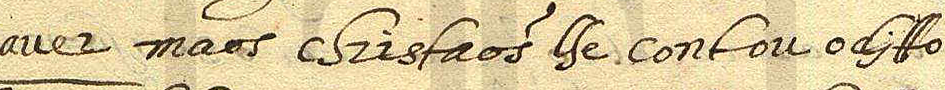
auer maos christaos̄ lhe contou o djtto
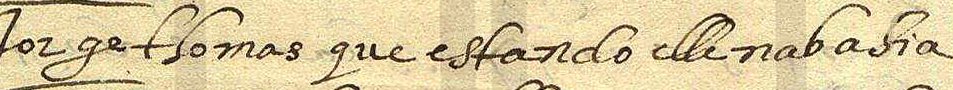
Jorge thomas que estando elle na bahia
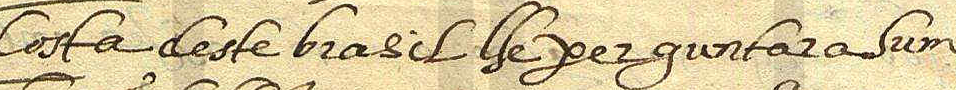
Costa deste brasil lhe perguntara hum
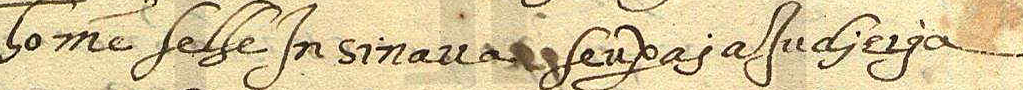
homē se lhe Jnsinaua seu paj a Judjerja
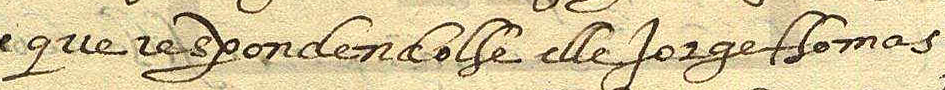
o que respondendolhe elle Jorge thomas
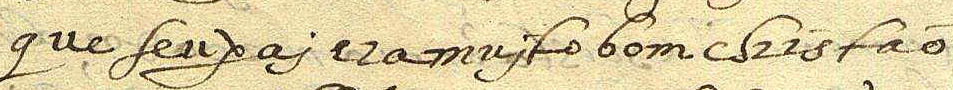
que seu paj era mujto bom christaõ
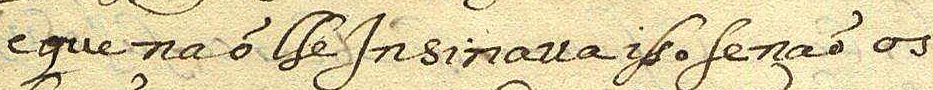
e que naõ lhe Jnsinaua isso senaõ os
